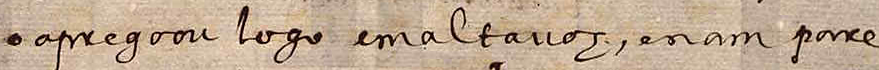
o apregoou logo em alta voz, e nam pare
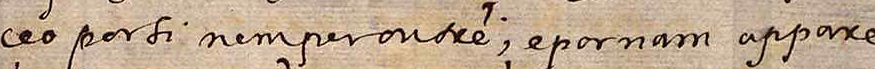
çeo por si nem per outrē; e por nam appare
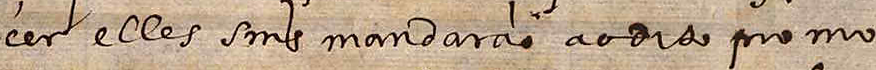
cer elles snrs̄ mandarão ao dito promo
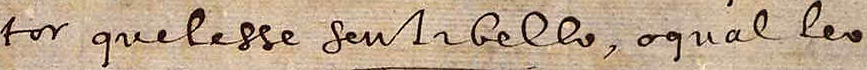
tor que lesse seu Libello, o qual leo
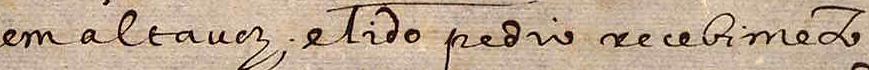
em alta voz; e lido pediu recebimēto
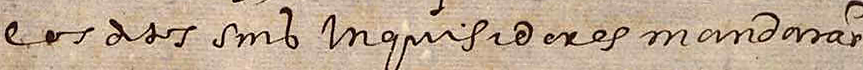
e os ditos snrs̄ Jnquisidores mandarão
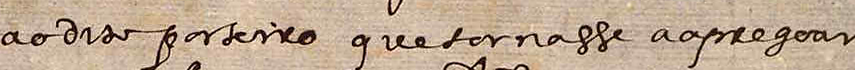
ao dito porteiro que tornasse a apregoar
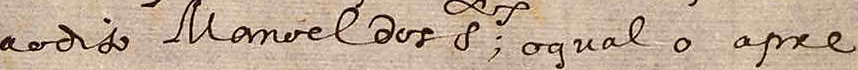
ao dito Manoel dos Stos; o qual o apre
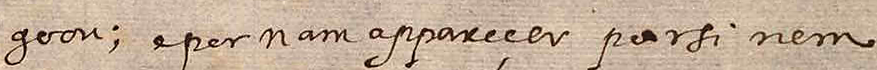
goou; e por nam appareçer por si nem
